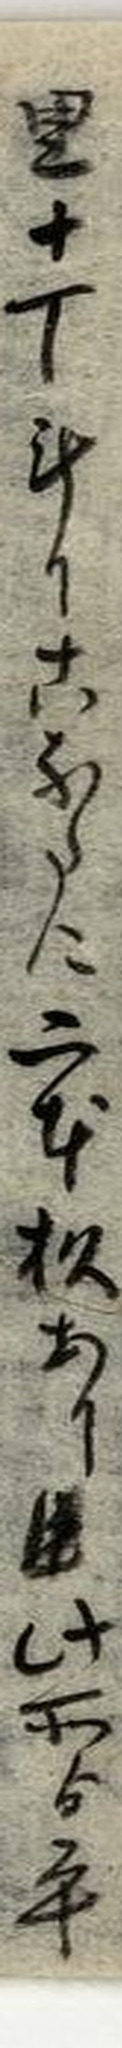里十丁斗りこなたに二本杉あり此所ゟ平
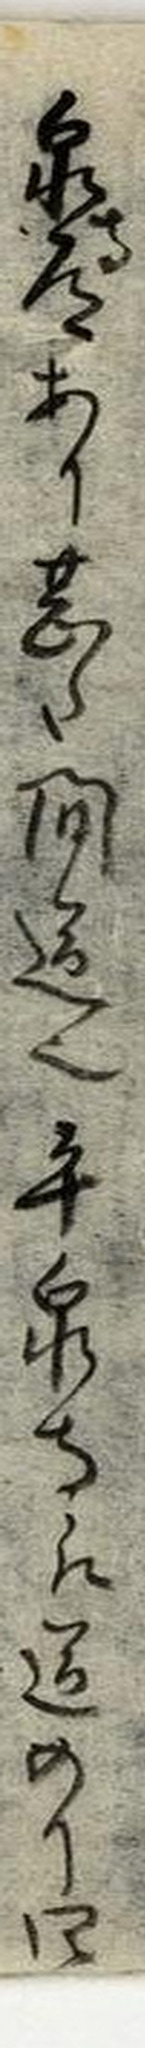泉あり寺道甚だ間道之平泉寺江道のり四
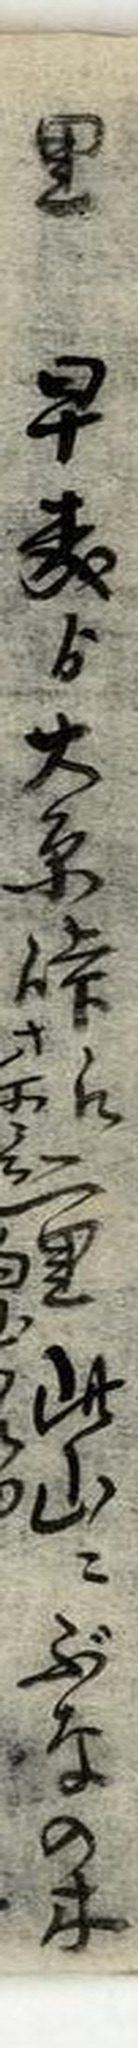里早森ゟ大原峠江二里此山ニぶなの木
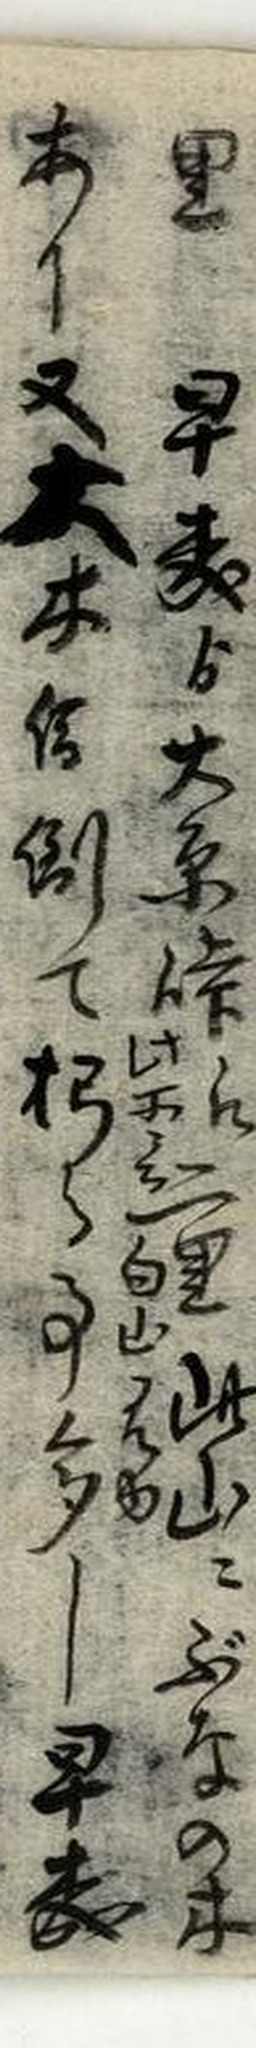あり又大木倒てる事多し早森
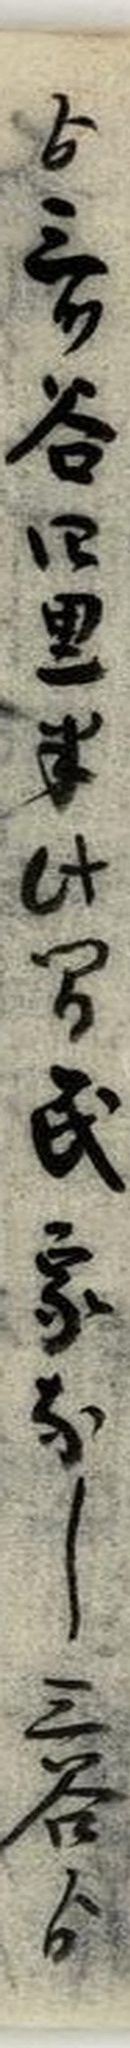ゟ三ツ谷四里半此間民家なし三谷ゟ
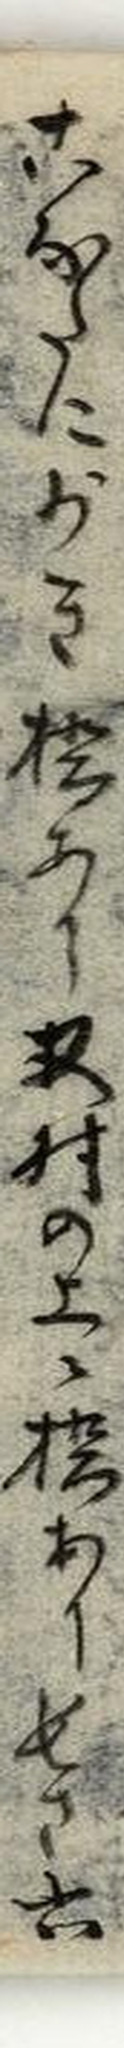こなたによきあり又村の上ニあり長さ六
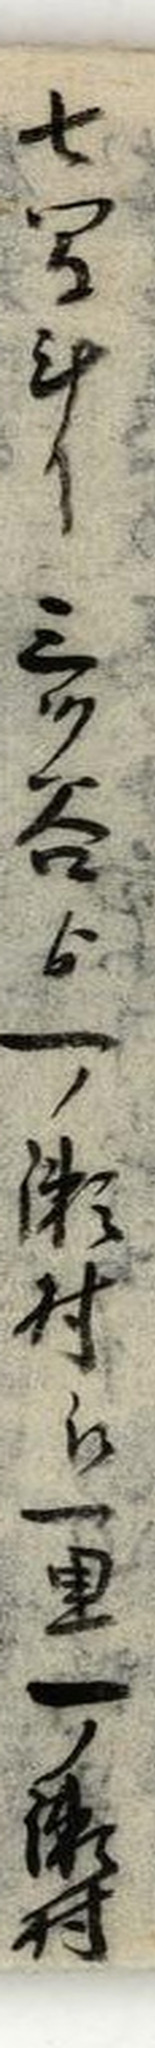七間斗り三ツ谷ゟ一ノ瀬村江一里一ノ瀬村
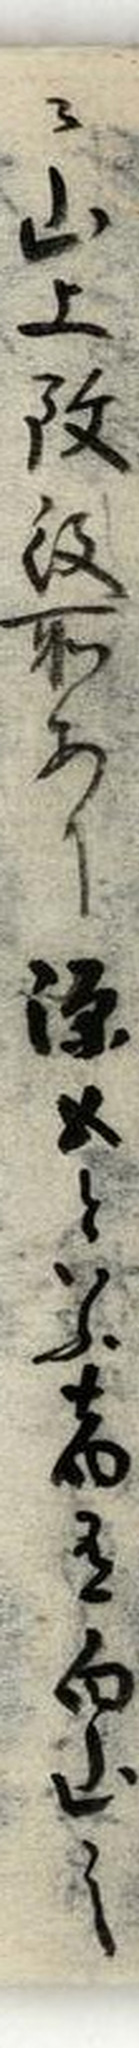ニ山上改役所あり源五といふ者有白山の
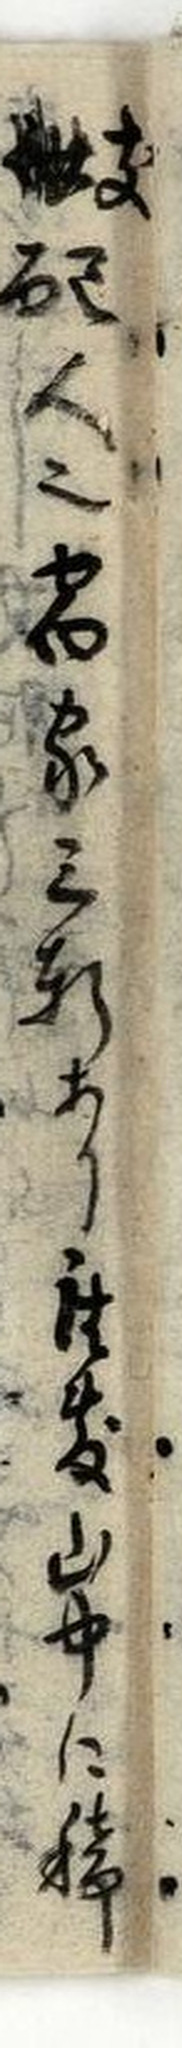支配人之宿家三軒あり座敷山中に稀
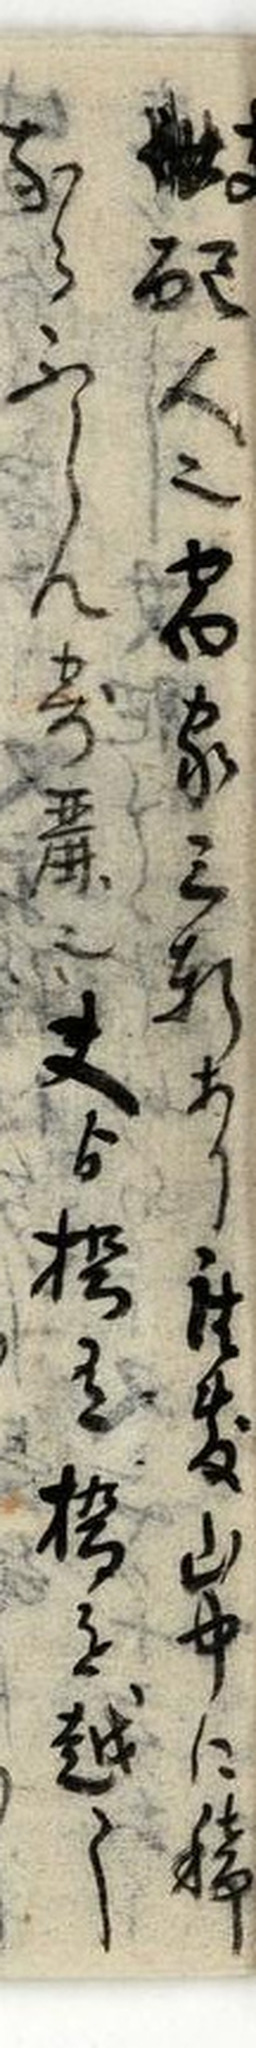なるふしん寄廉也夫ゟ橋有橋を越し
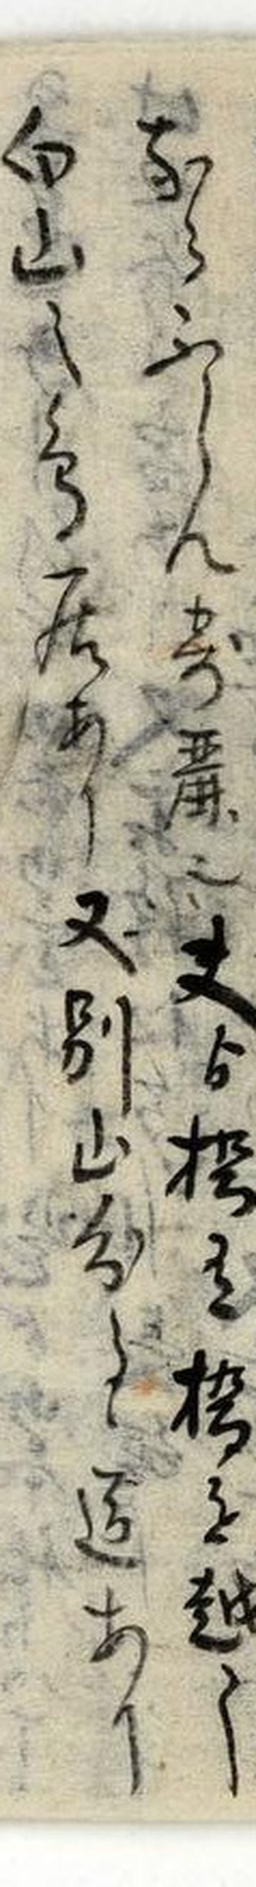白山之鳥居あり又別山分る〃道あり
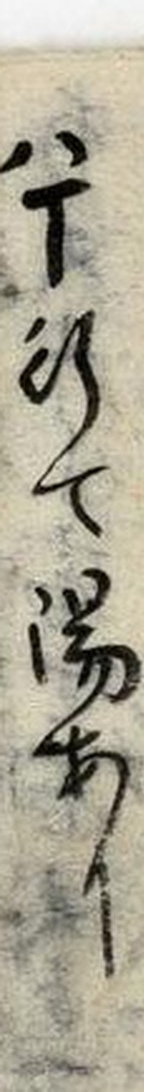八丁行て湯あり
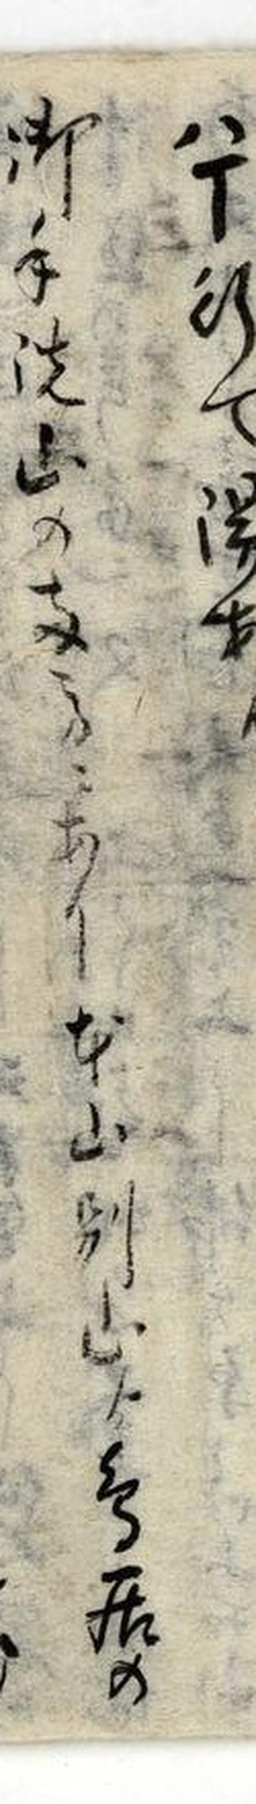御手洗山の両方ニあり本山別山ゟ鳥居の
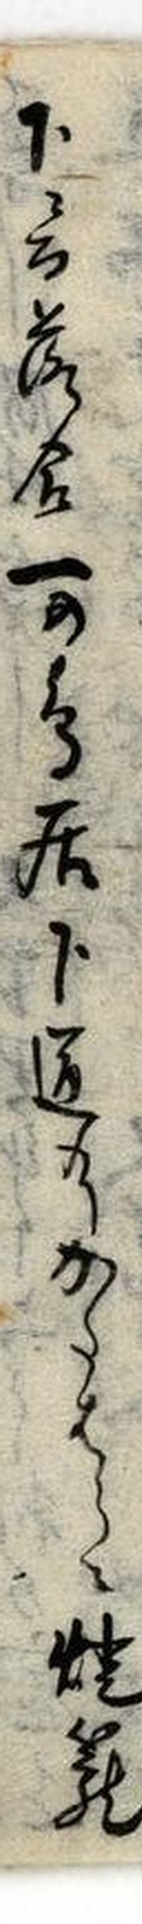下ニて落合一の鳥居下道のかたはらニ燈籠
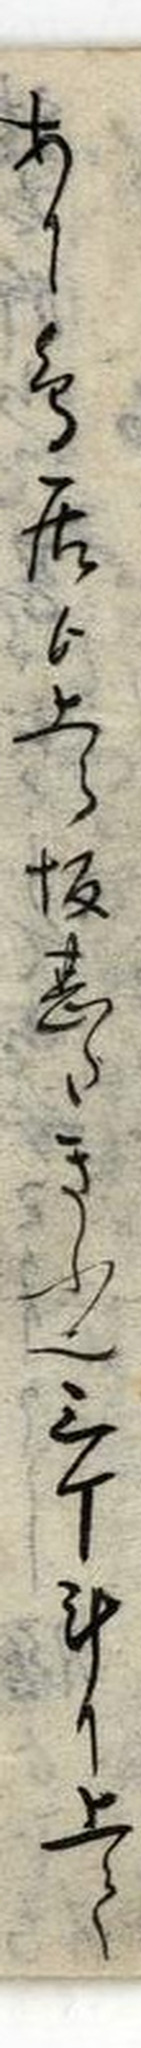あり鳥居ゟ上る坂甚だきふ也三丁斗り上て
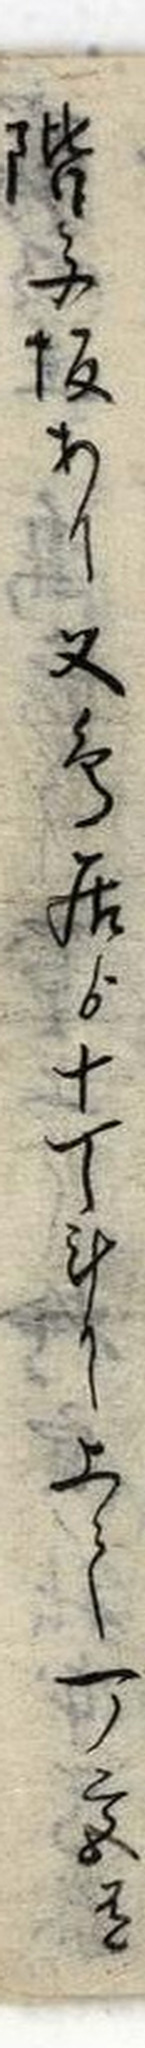階子坂あり又鳥居ゟ十丁斗り上に一ノ宮有
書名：白山道中名所筆記（旅日記）
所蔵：福井県文書館 Fukui Prefectural Archives
